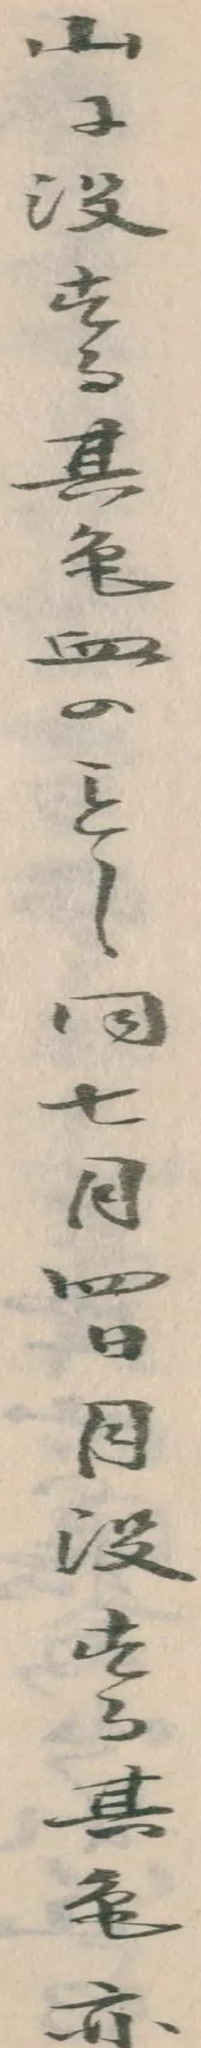山に没する其色血のことし同七月四日月没する其色亦
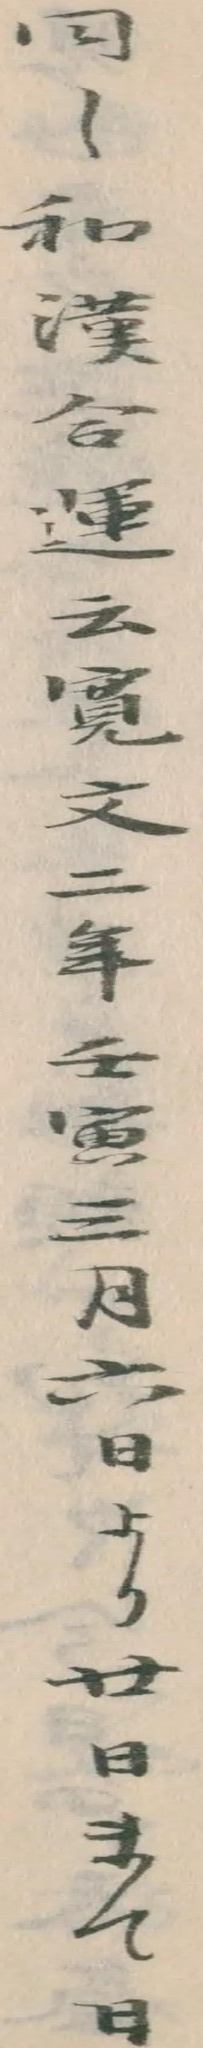同し和漢合運云寛文二年壬寅三月六日より廿日まで日
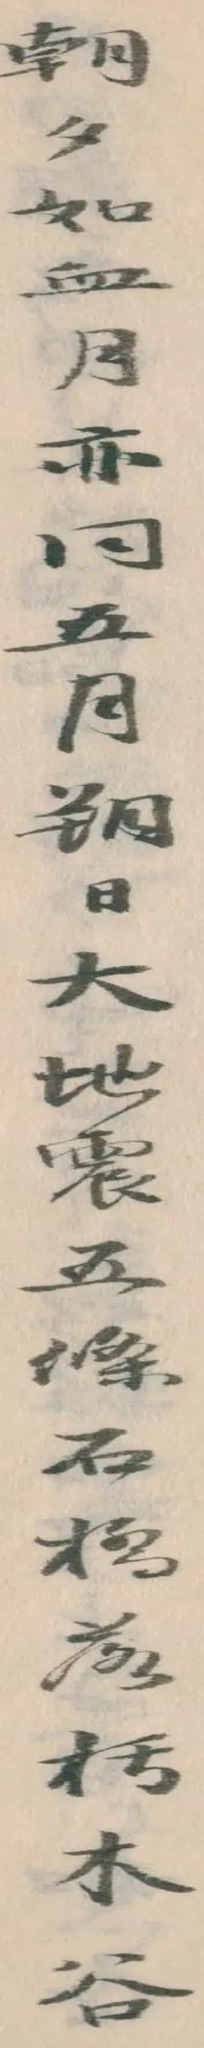朝夕如血月亦同五月朔日大地震五条石橋落朽木谷
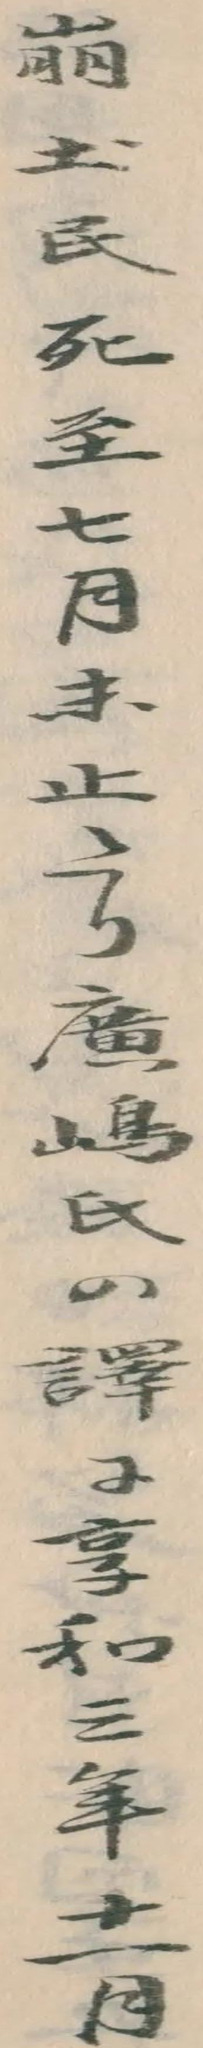崩土民死至七月未止たり広嶋氏の訳に享和三年十一月

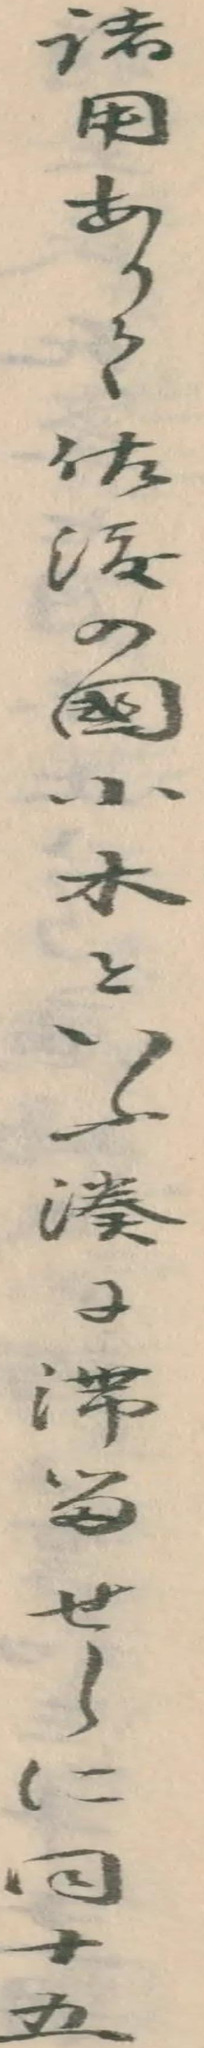諸用ありて佐渡の国小木といふ湊に滞留せしに同十五
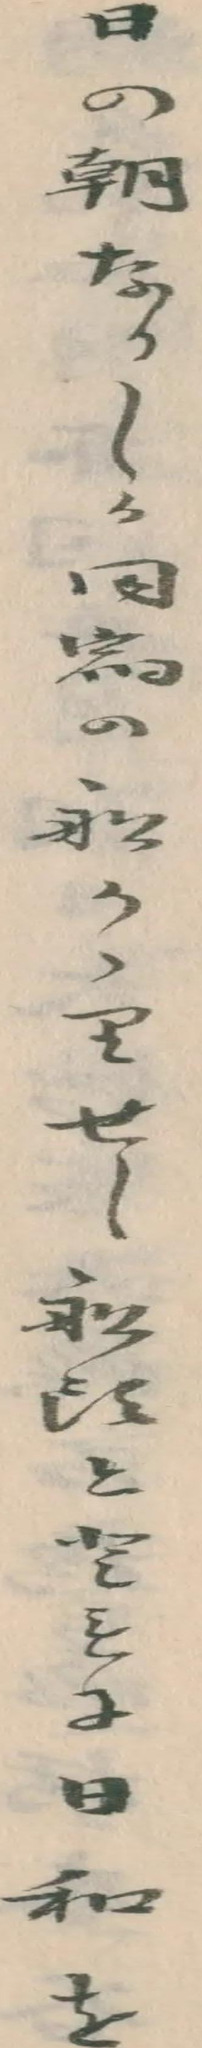日の朝なりしか同宿の船かゝりせし船頭とともに日和を
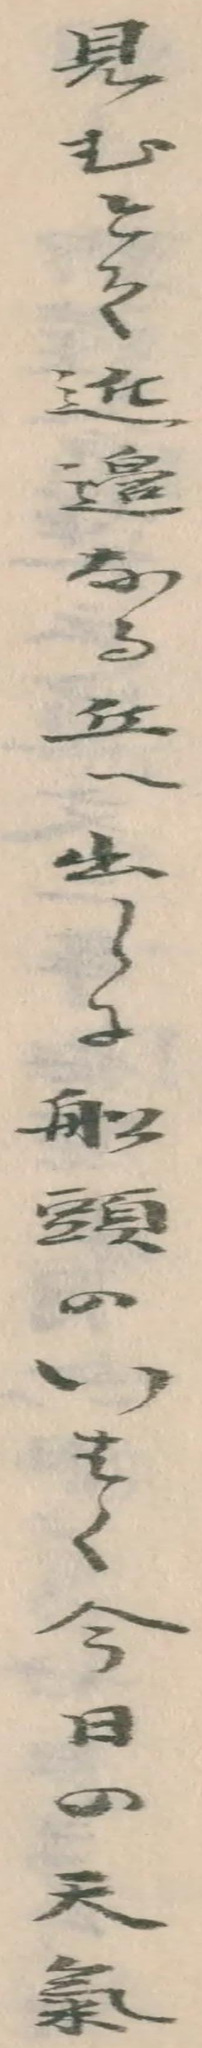見むとて近辺なる丘へ出しに船頭のいはく今日の天気
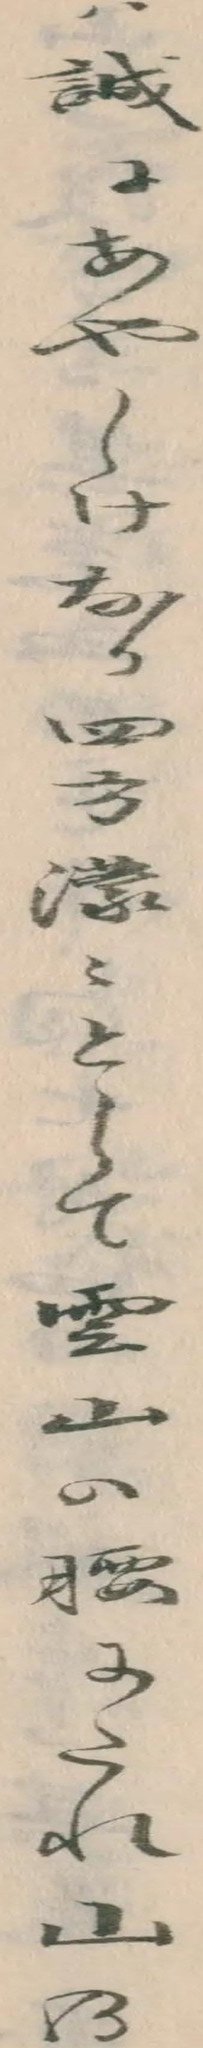は誠にあやしけなり四方濛々として雲山の腰にたれ山の
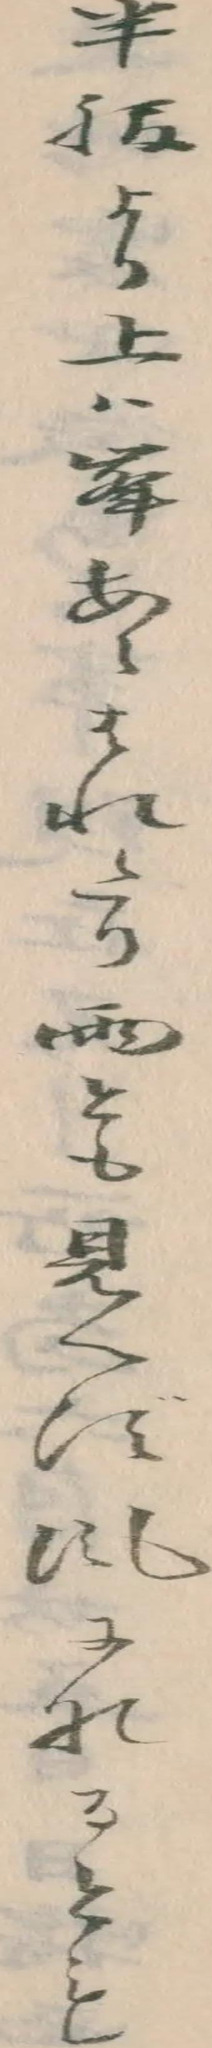半腹より上は峰あらはれたり雨とも見へず風になるとも
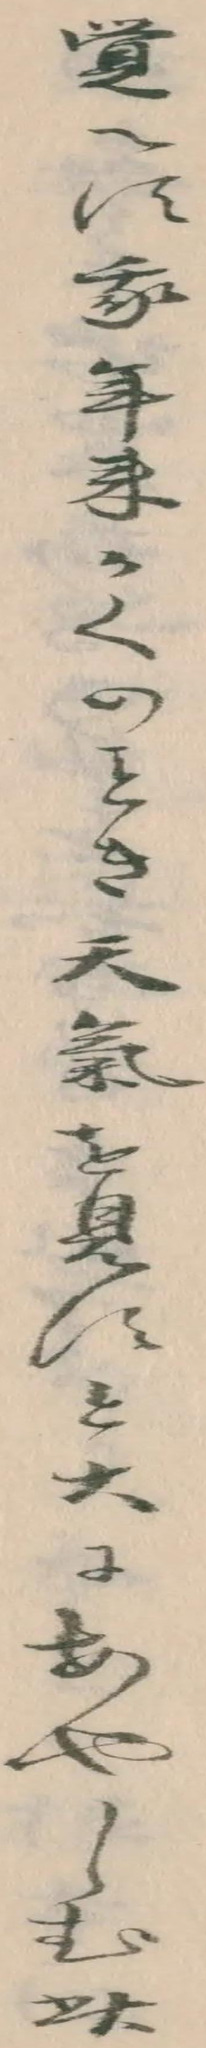覚へす我年来かくのことき天気を見すと大にあやしむ此
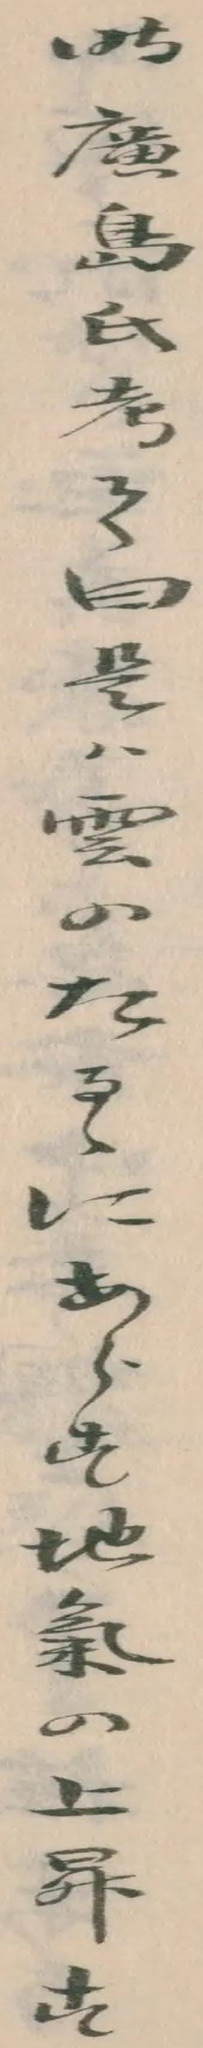時広島氏考て曰是は雲のたるゝにあらす地気の上昇す
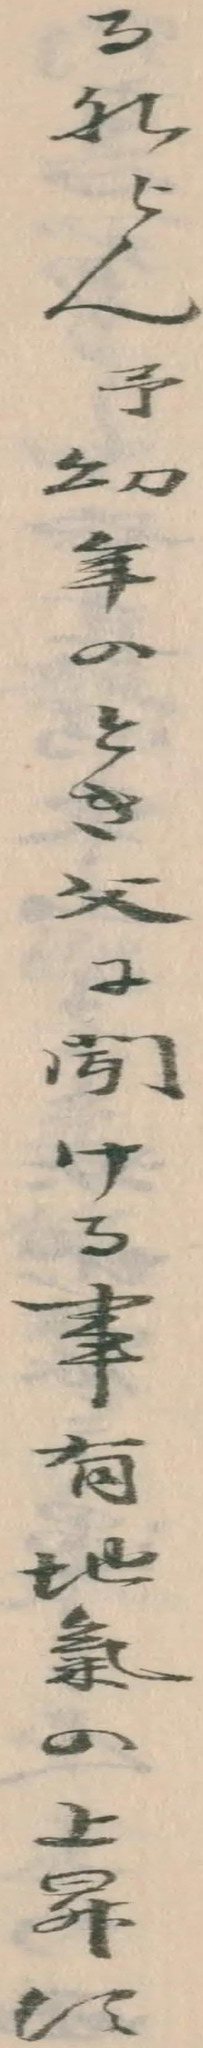るならん予幼年のとき父に聞ける事有地気の上昇す
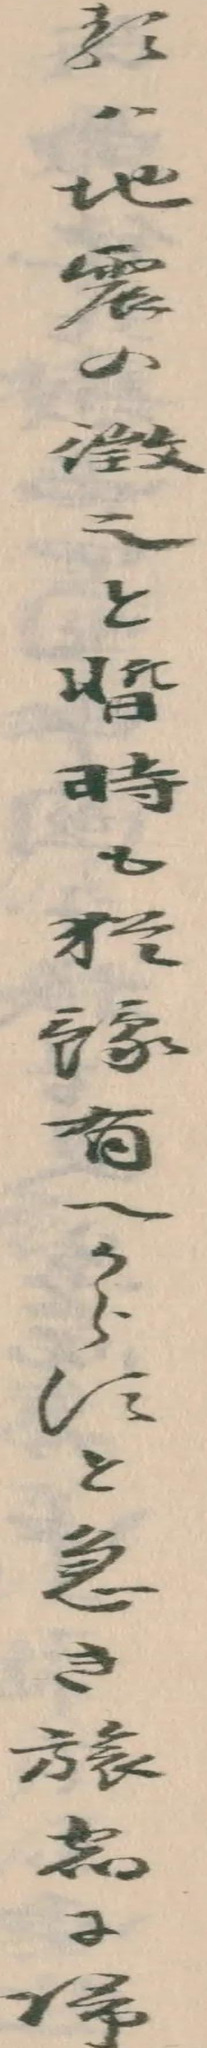るは地震の徴也と暫時も猶余有へからすと急き旅宿に帰
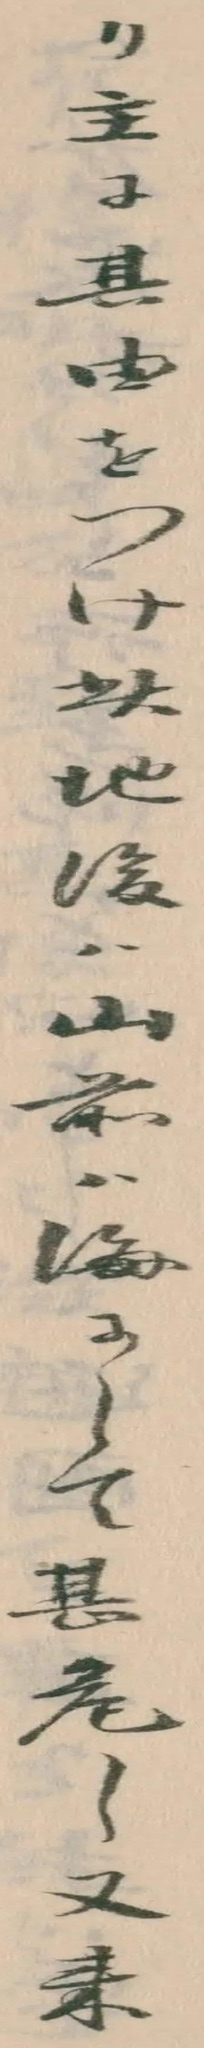り主に其由をつけ此地後は山前は海にして甚危し又来
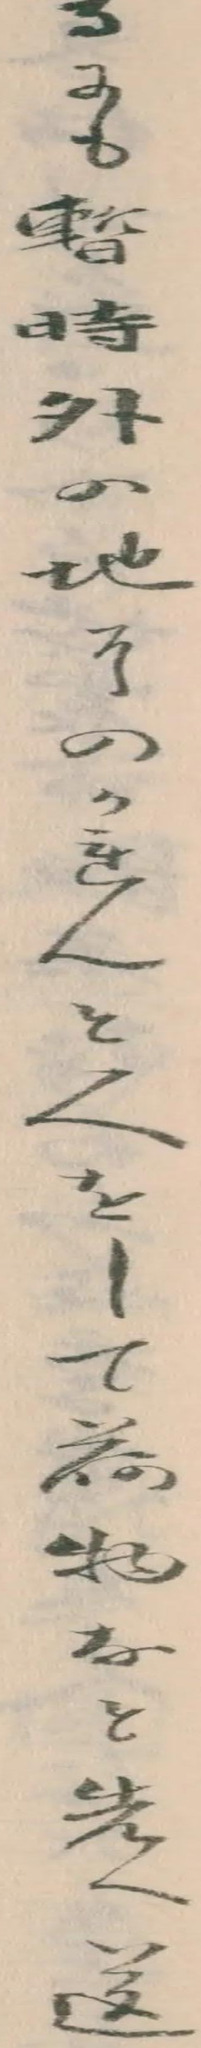るにも暫時外の地にのかれんと人をして荷物なと先へ送
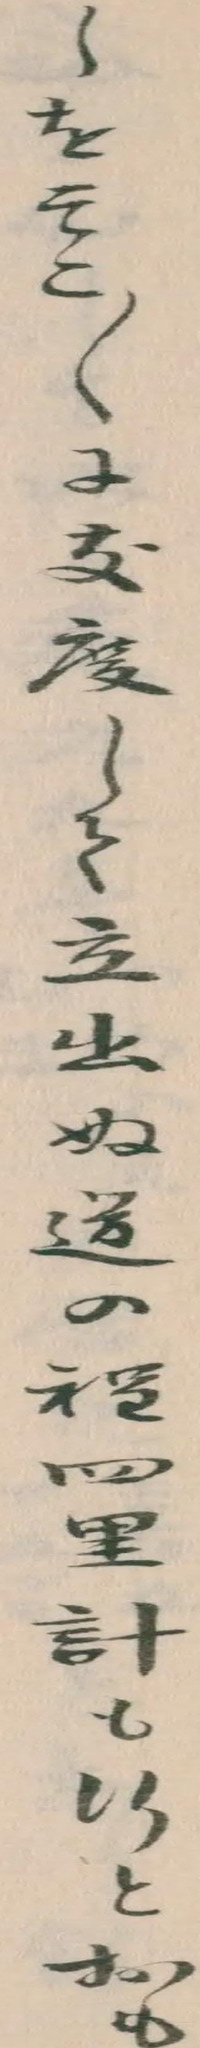しをそこ〳〵に支度して立出ぬ道の程四里計も行とおも
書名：地災撮要. 巻11-12(地震之部)
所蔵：国立国会図書館 National Diet Library, JAPAN
